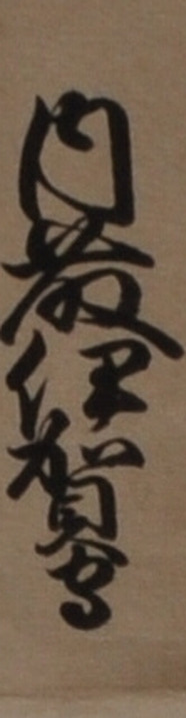内藤伊賀守
